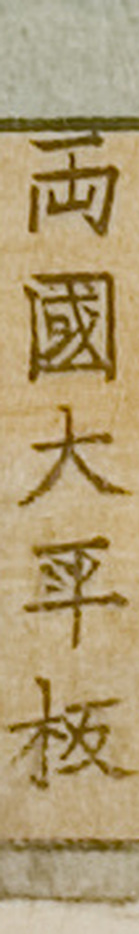両国大平板

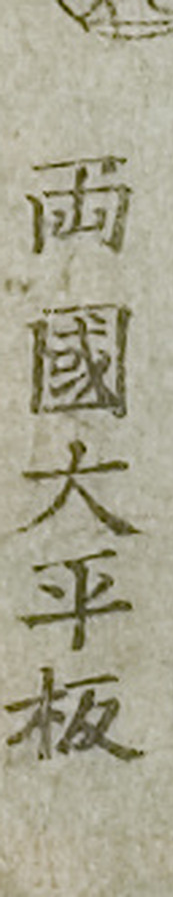両国太平板
